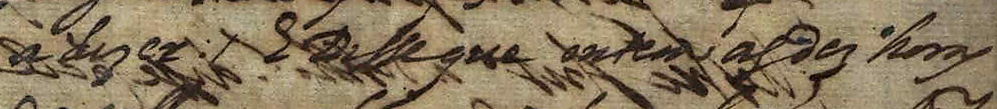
a dizer./ E Disse que ontem as dez horas
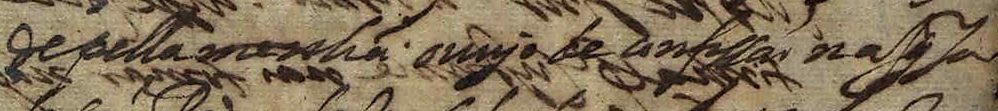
de pella menhā ouujo de confissaõ na JḡJa
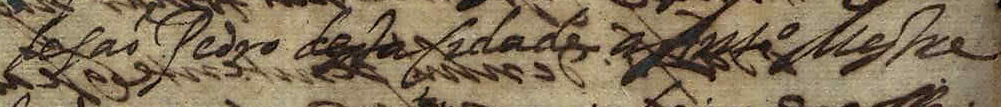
de saõ Pedro desta Cidade a Anto Mestre
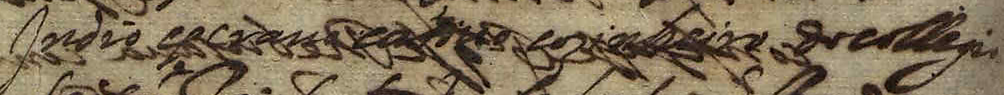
Jndio escrauo catiuo cozinheiro do collegio
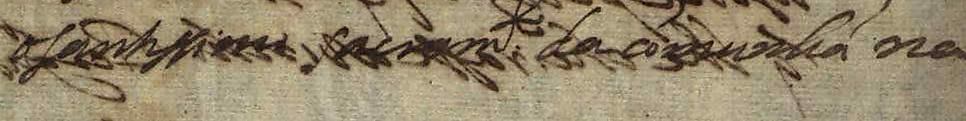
o santissimo sacramto da comunhā na
